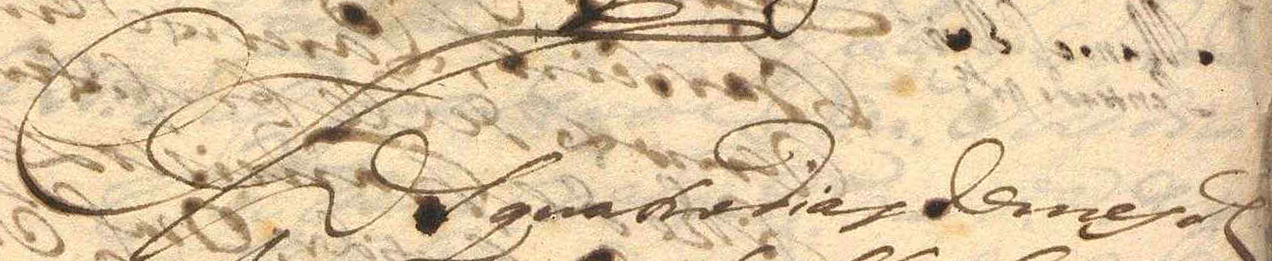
Aos quatro dias do mes de
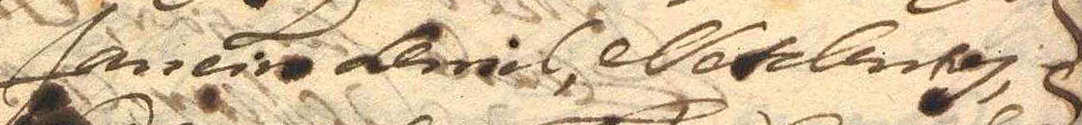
Janeiro de mil, e SeteCentos, e
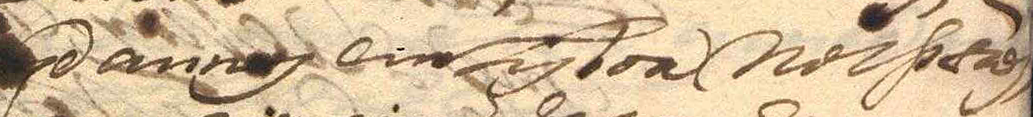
ze annos em Lisboa nos estaos,
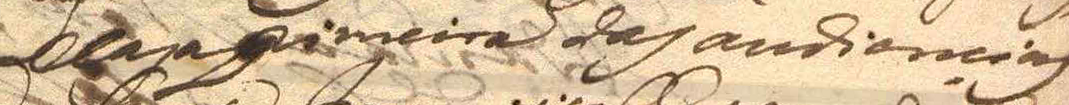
e casa primeira das audiencias
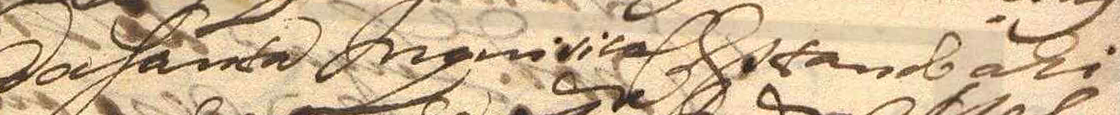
da santa Inquisiçaõ Estando ahi
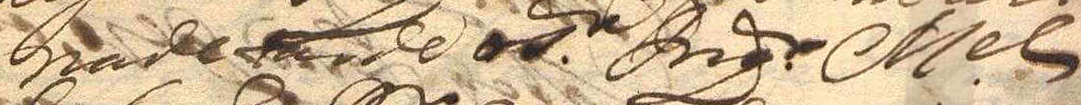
na de tarde o s.or Jnq.or M.el
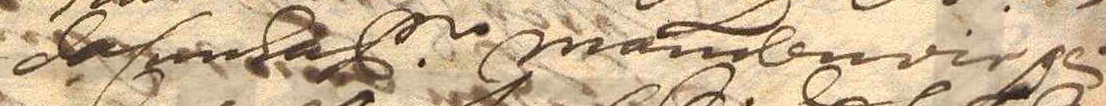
da Cunha P.r mandou vir pe
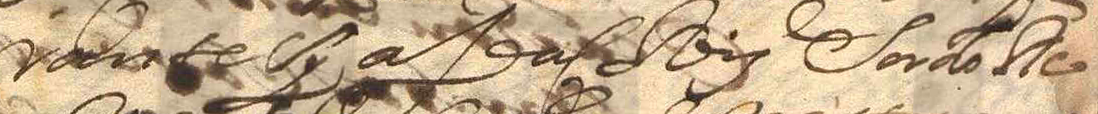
rante sy a Joaõ Rois̄ Sordo Reo
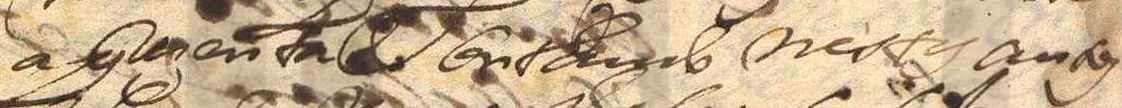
apRezentado e Contheudo nestes autos
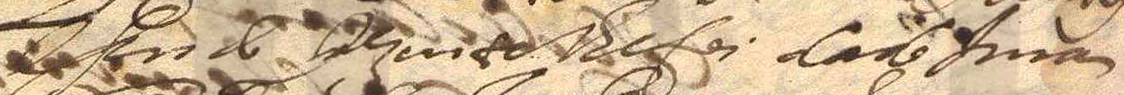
e sendo pRezente lhe foi dado Jura
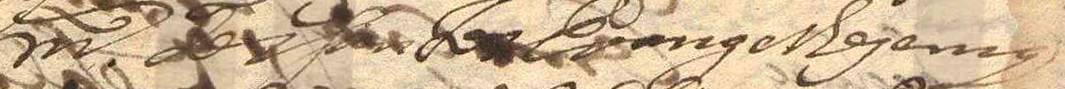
m.to dos santos Evangelhos em q̄
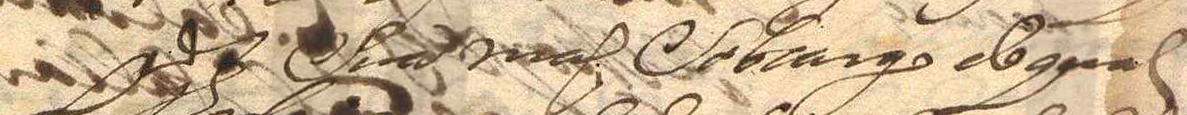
pos sua maꝭ Sob cargo do qual
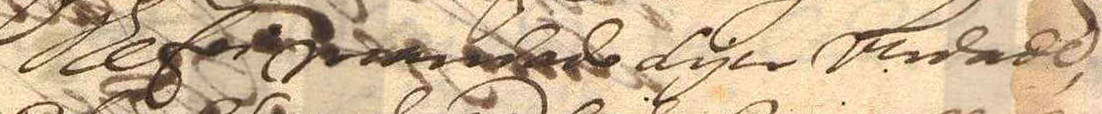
lhe foi mandado dizer verdade,
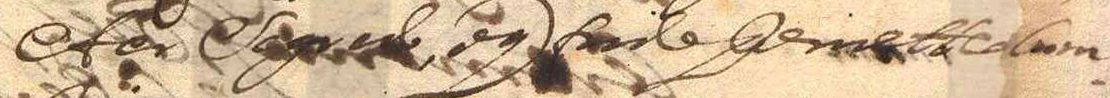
e ter Segredo, o q̄ tudo pRometteo Cum
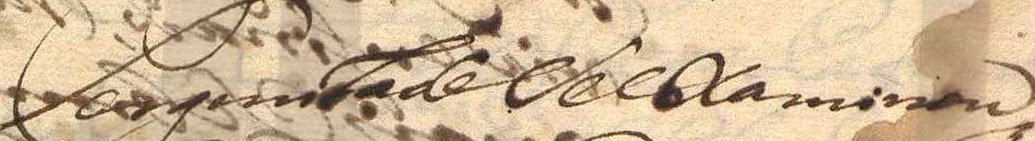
Perguntado se eXaminou
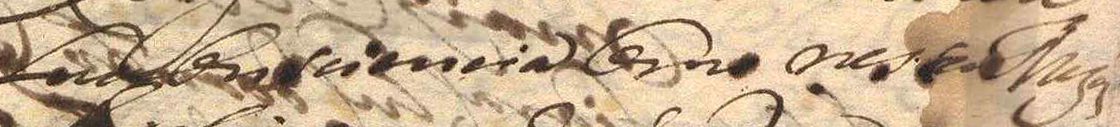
sua Consciencia Como nesta Mesa
